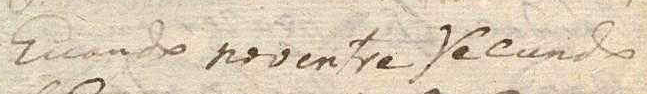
Quando no ventre fecundo
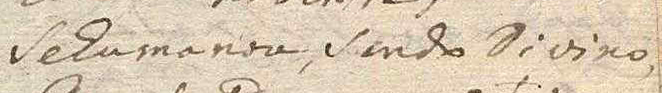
Se humanou, Sendo divino,
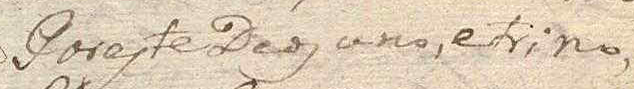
Por este Deos uno, e trino,
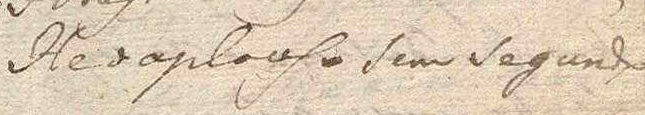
He o aplauso Sem Segundo
